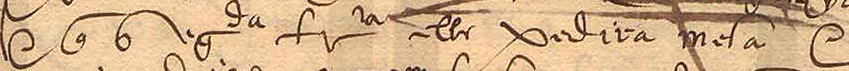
e q̄ segda fera elle pedira mesa e
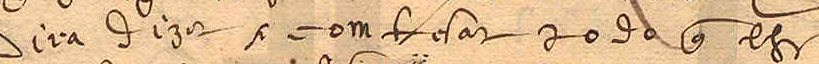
vira dizer e comfesar todo q̄ lhe
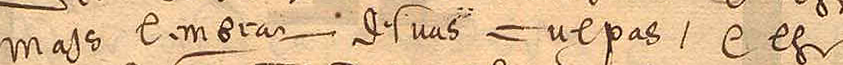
majs lembrar de suas culpas / e lhe
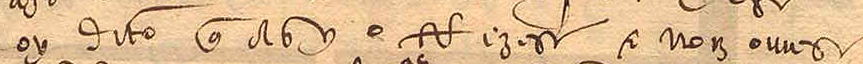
foy dit̄o q̄ Asy o ffizese e nom ouuese
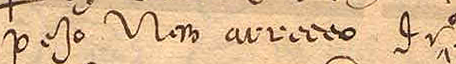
peJo Nem arreceo de
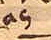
as
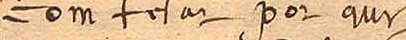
comfesar porque
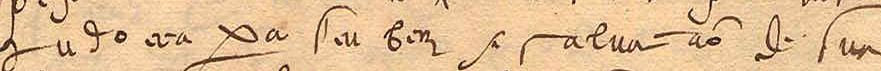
tudo era ꝑa seu bem e saluaçaõ de sua
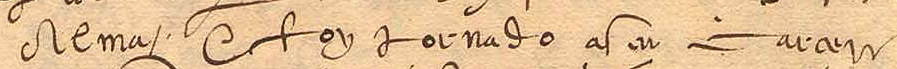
Alma / e foy tornado a seu carcere
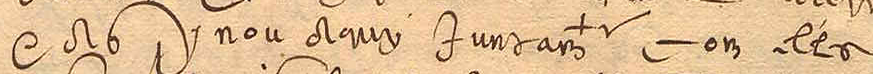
e Asynou Aquy Juntamte com elles
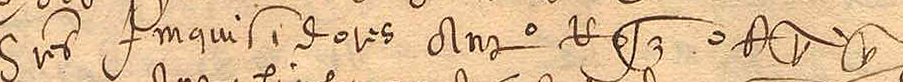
Sr̄es Jmquisidores Anto Rōjz o stp̄vy
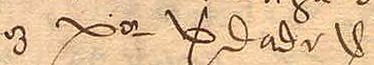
fez por ꝟdade
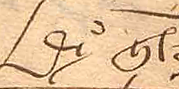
Dio ḡlz
